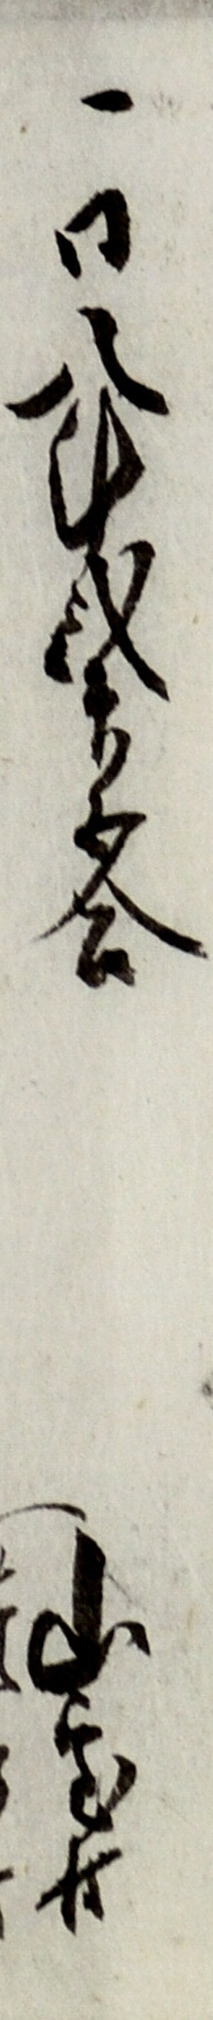一同八斗弐升五合山室村
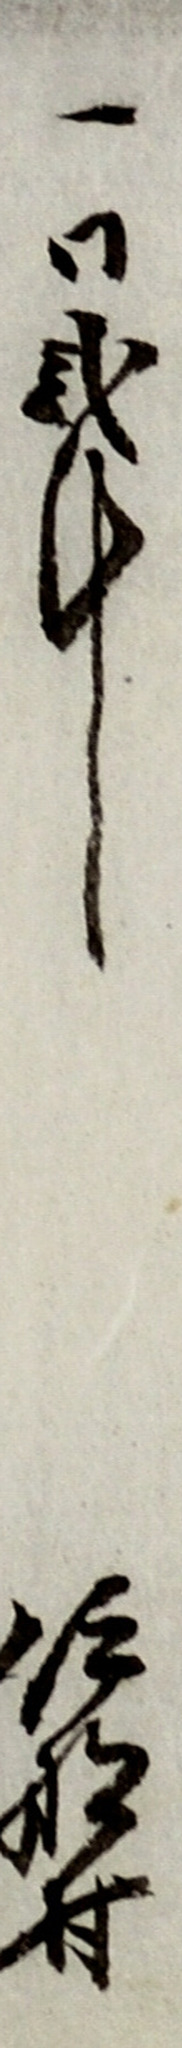一同弐斗伊那村
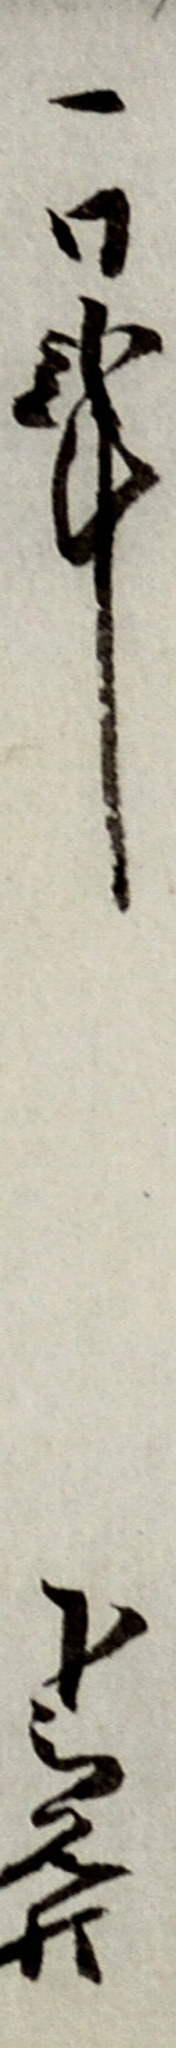一同弐斗下高見村
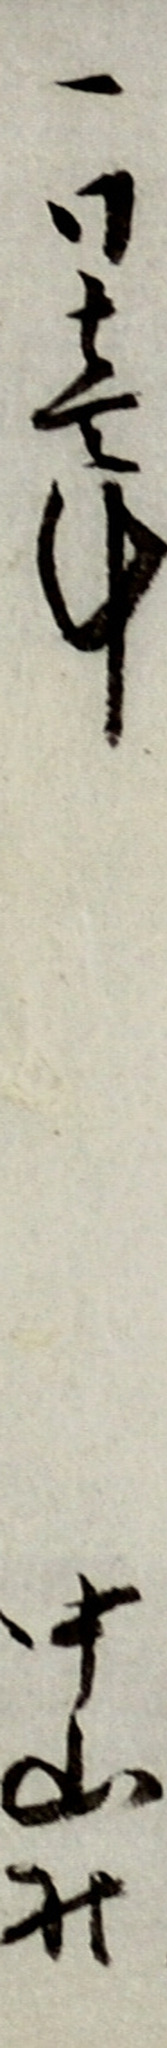一同壱斗中山村
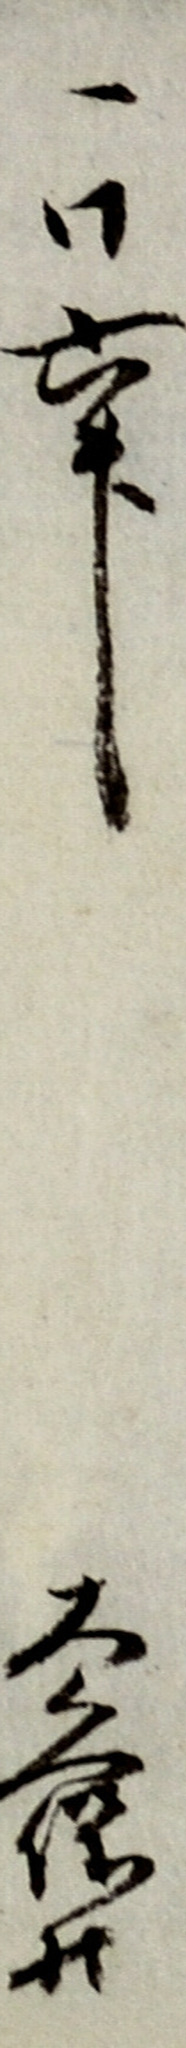一同六升大久保村
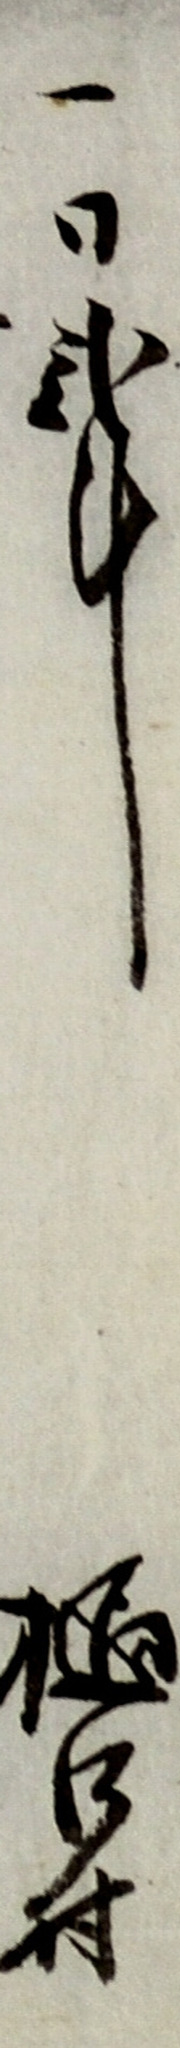一同弐斗樋口村
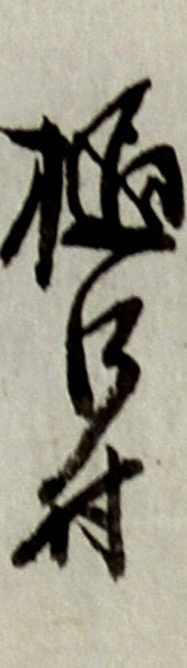荊口村
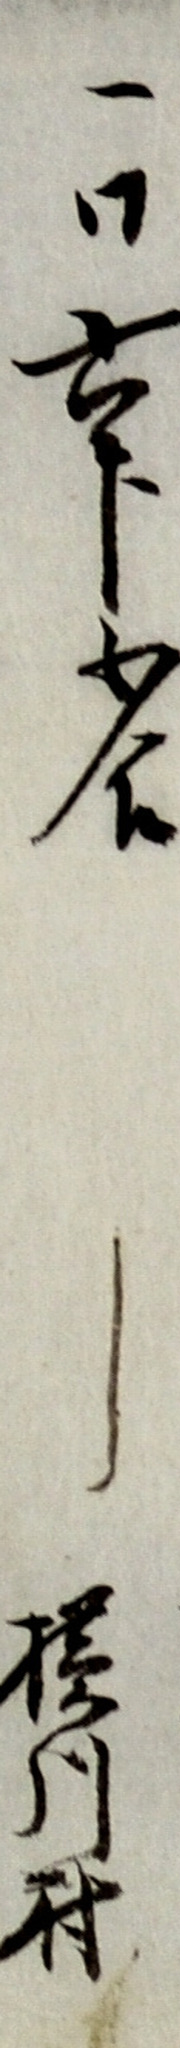一同六升五合横川村
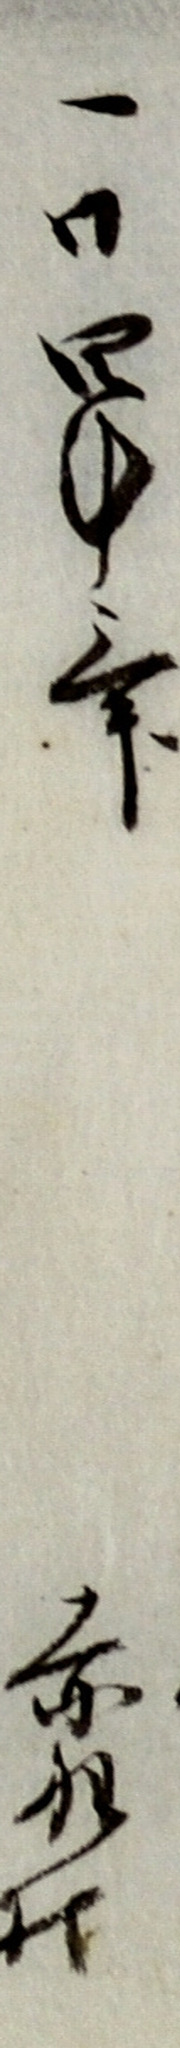一同四斗三升赤羽村
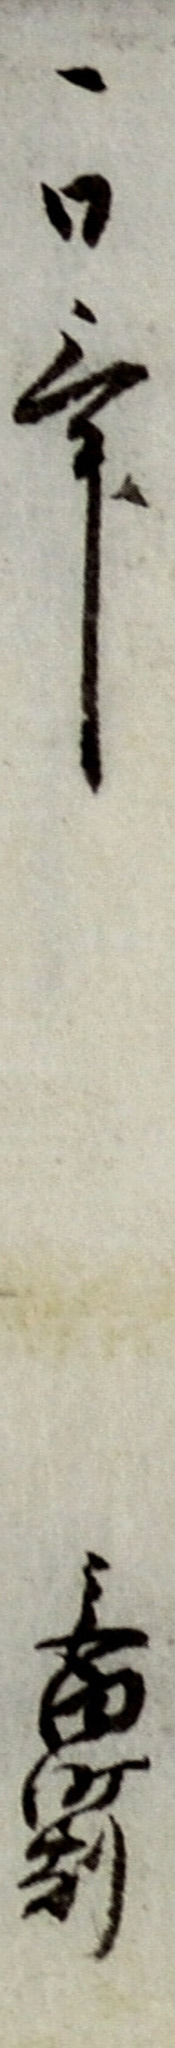一同三升宮田町割
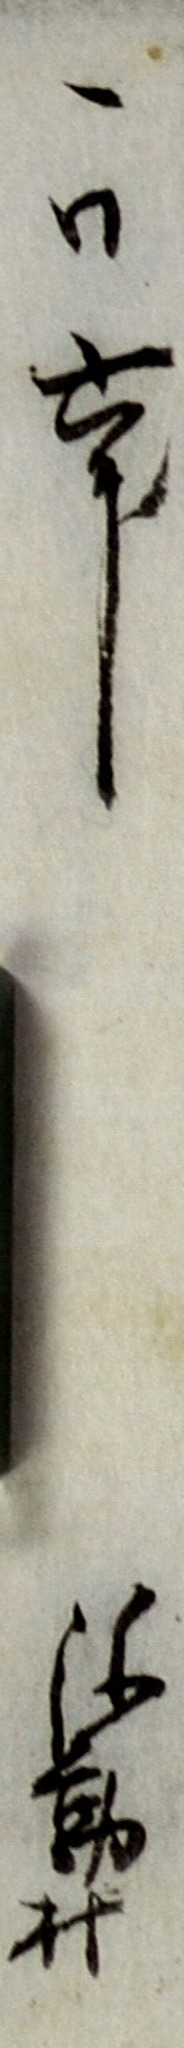一同六升弥勒村

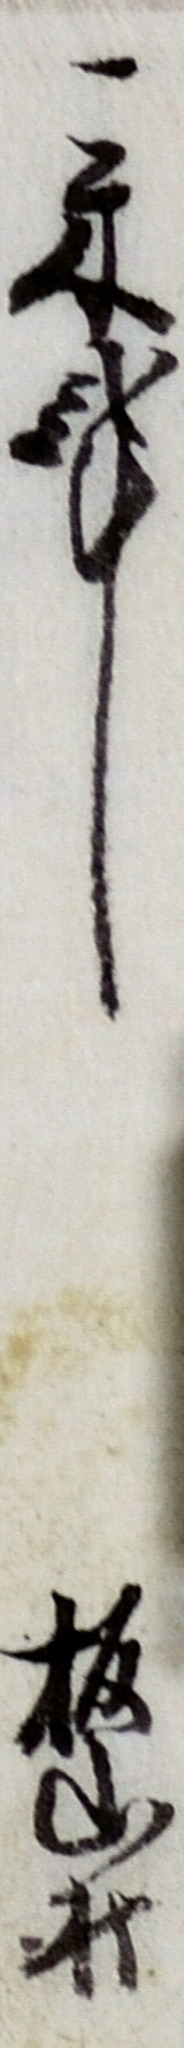一米二斗板山村
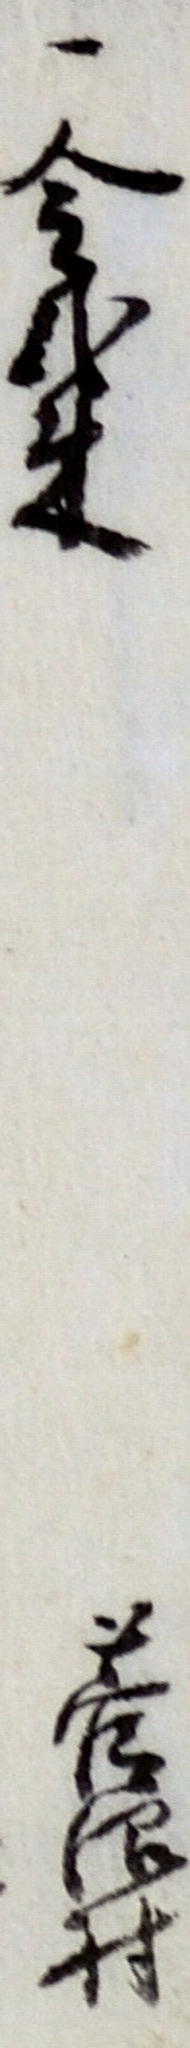一金弐朱菅沼村
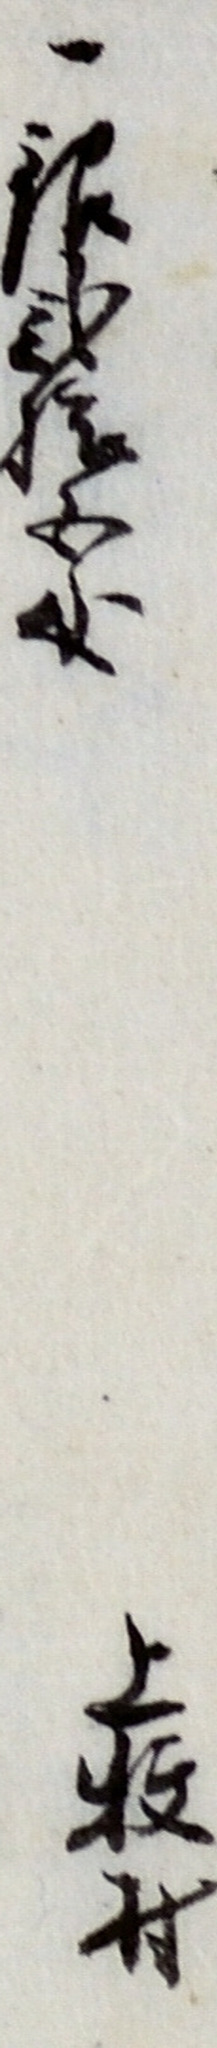一銀弐拾五匁上牧村
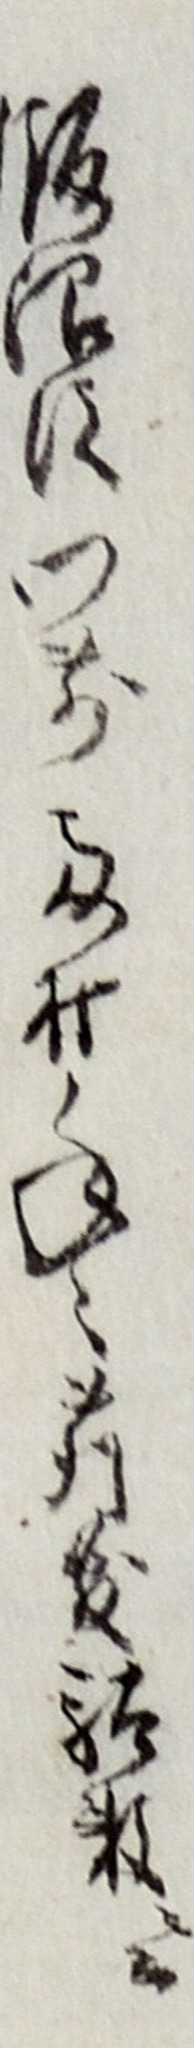飯沼沢門前両村年々苅敷駄数ニ而
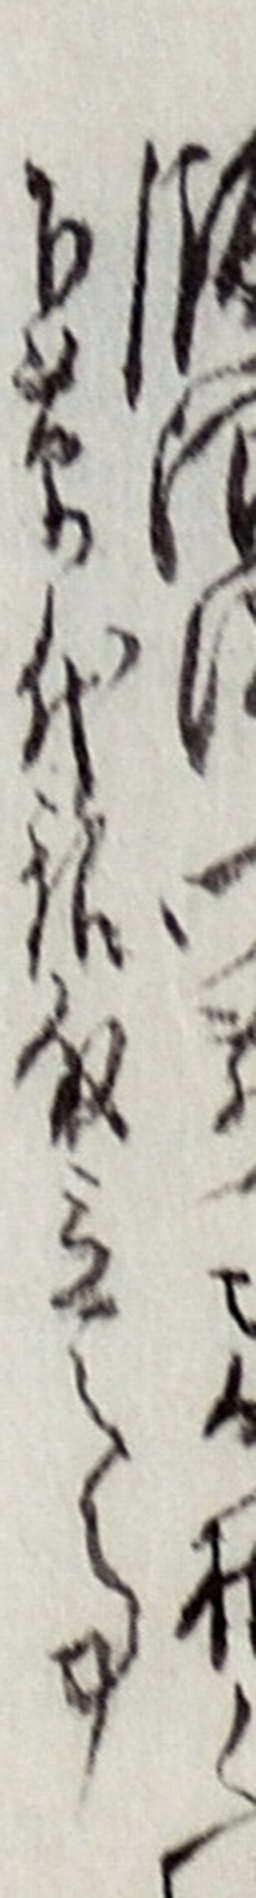下草代銀取立之事
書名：御立山控
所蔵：伊那市立高遠町図書館・合同会社AMANE
